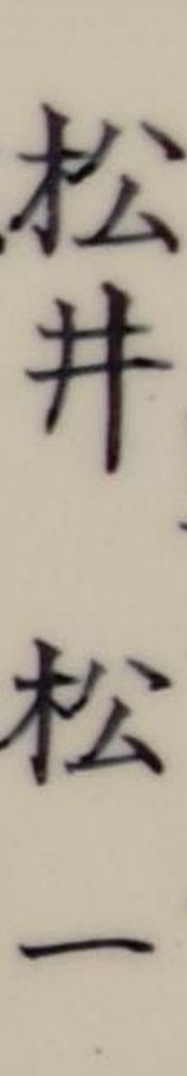松井松一
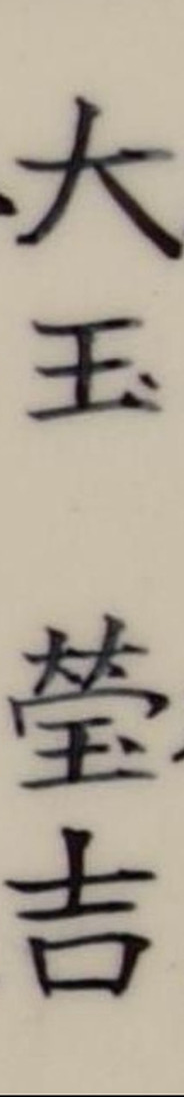大玉瑩吉
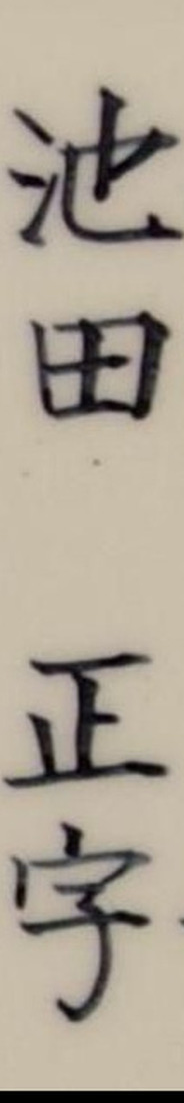池田正宇
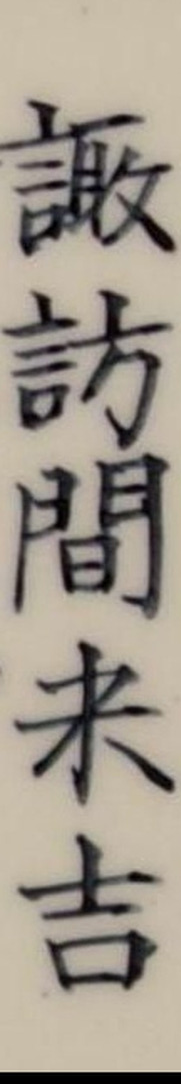諏訪間米吉
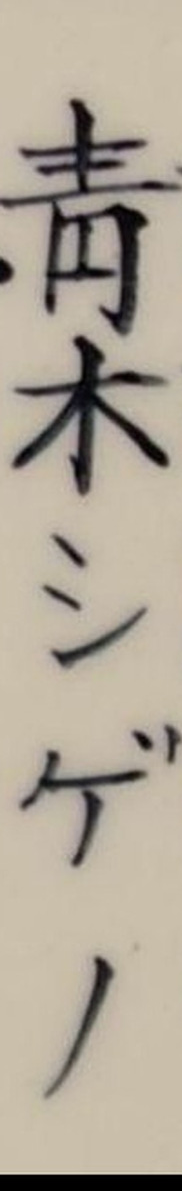青木シゲノ
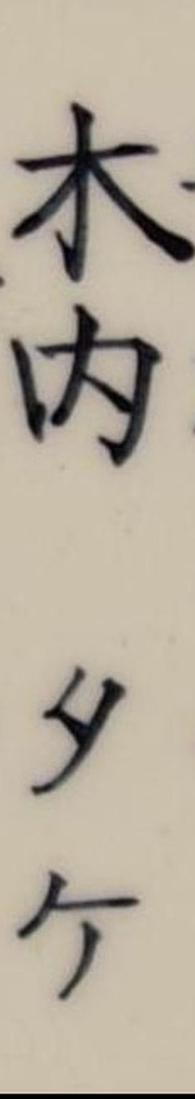木内タケ
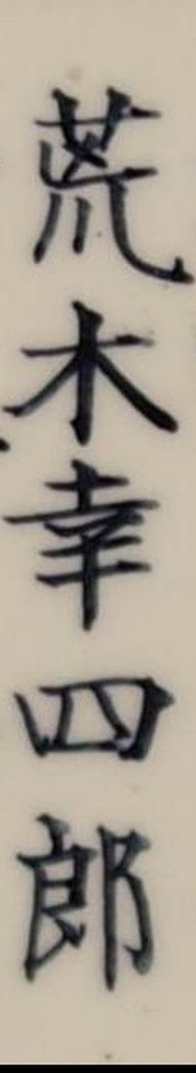荒木幸四郎
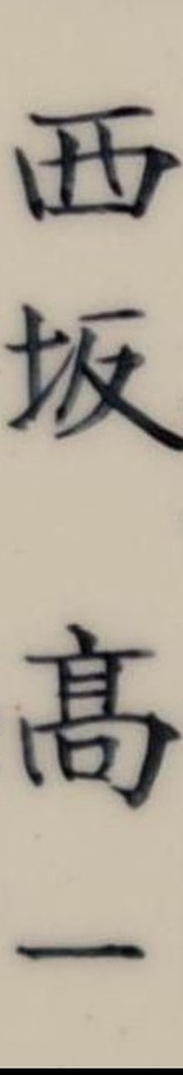西坂高一
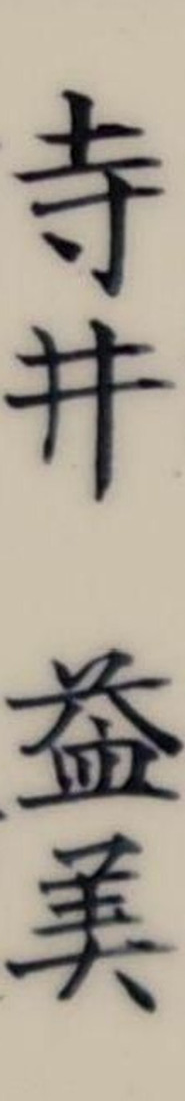寺井益美
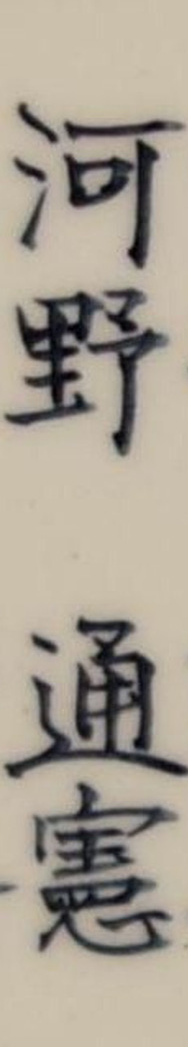河野通憲
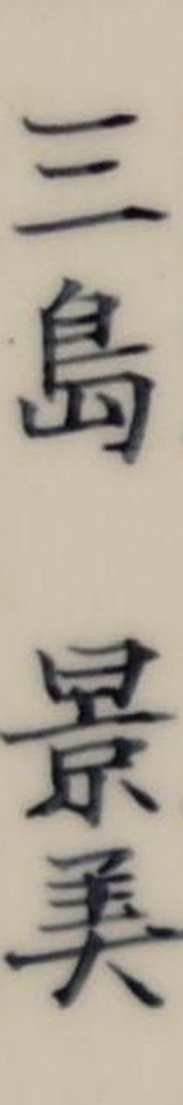三島景美
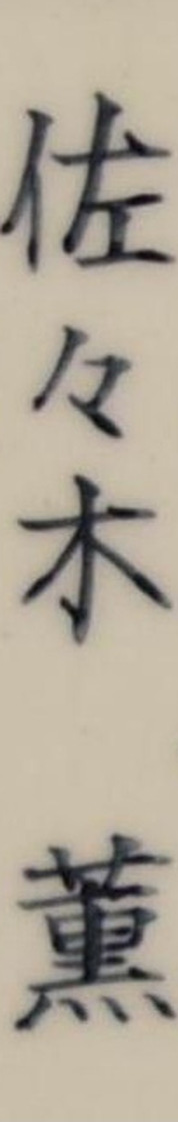佐々木薫
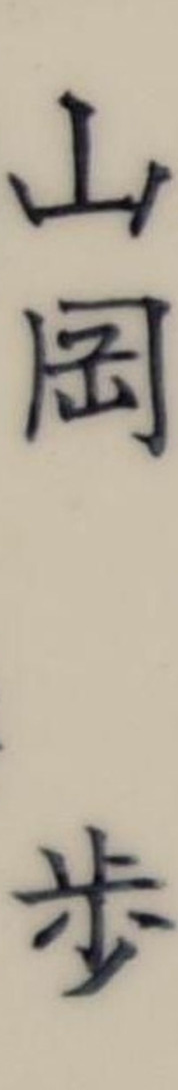山岡歩
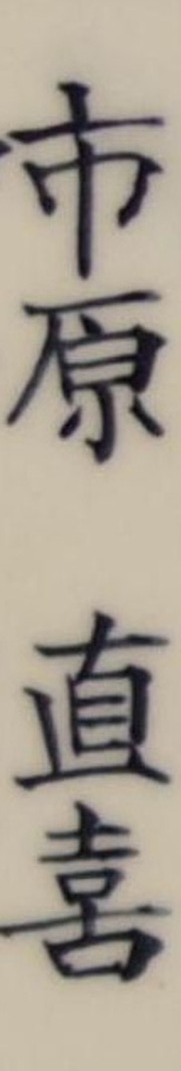市原直喜
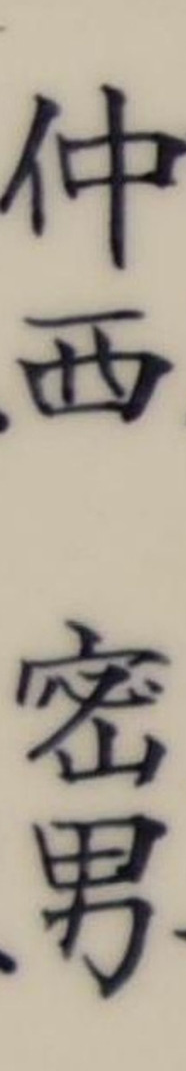仲西密男
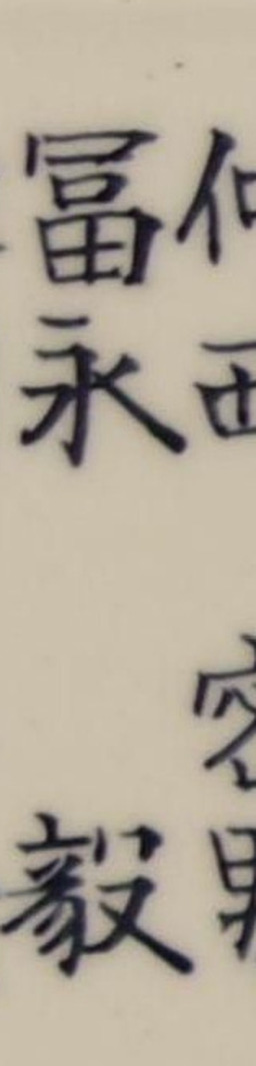冨永毅
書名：M~S
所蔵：高野山金剛峯寺
